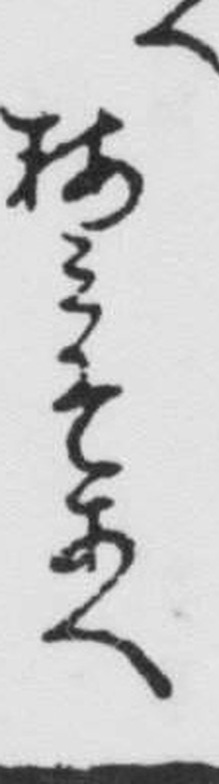梅みそあへ
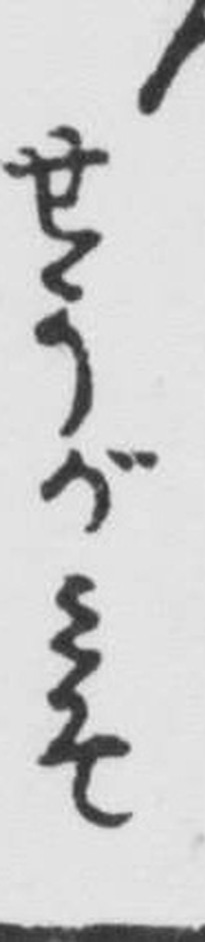せうがみそ
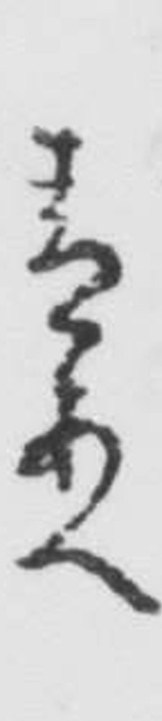青あへ
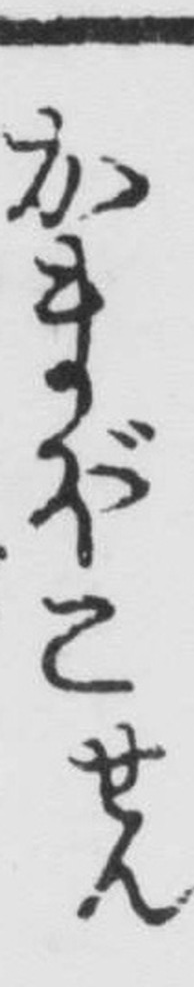かまぼこせん
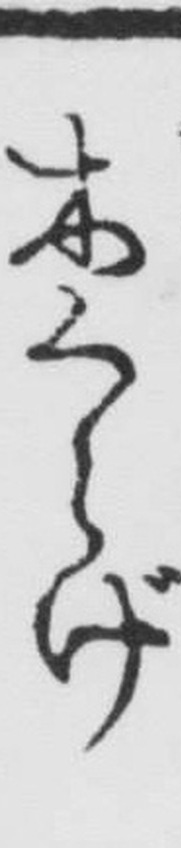木くらげ
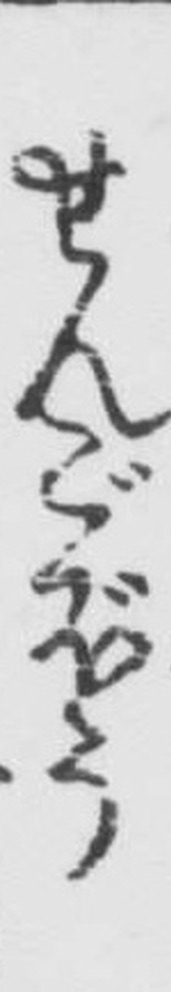せんごぼう
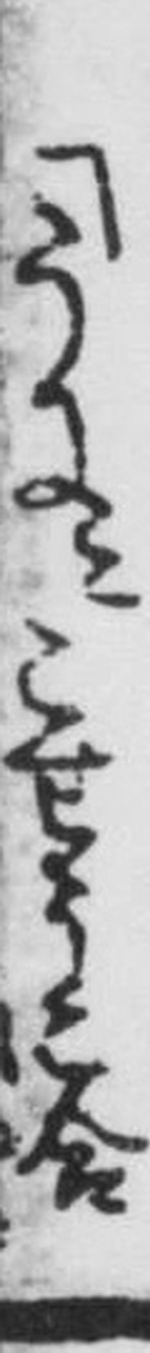〽うにとこせうと合
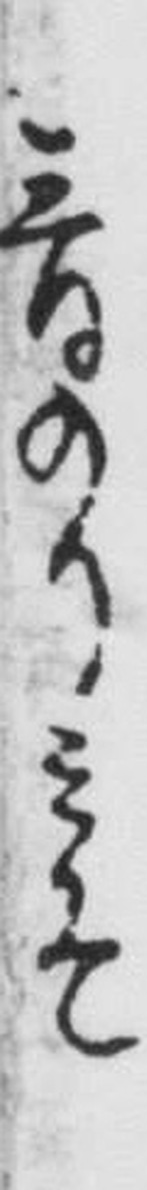青のりみそ
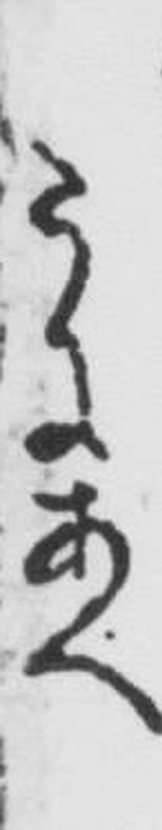うにあへ
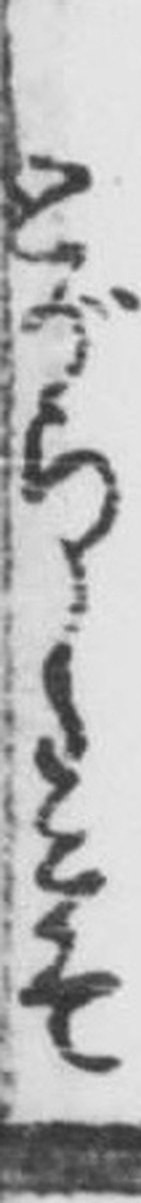とがらしみそ

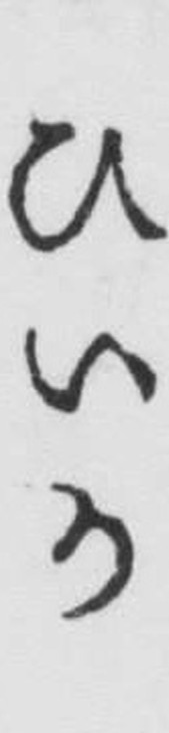ひいか
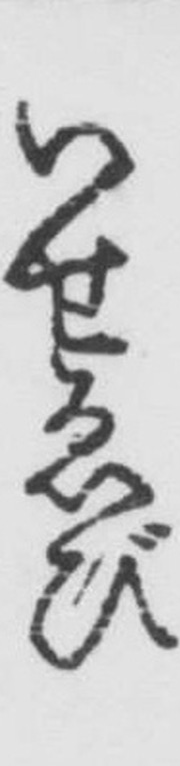いせゑび
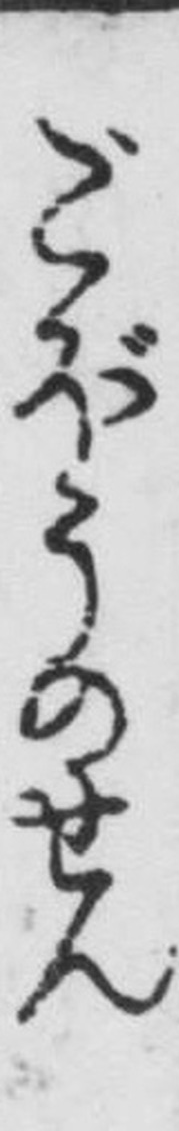ごぼうのせん
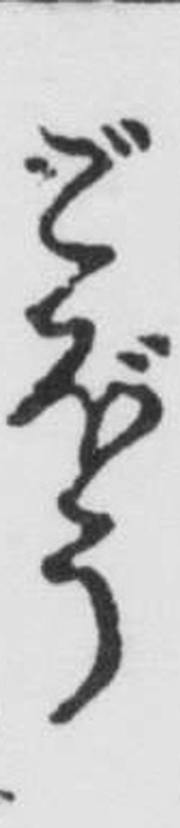ごぼう
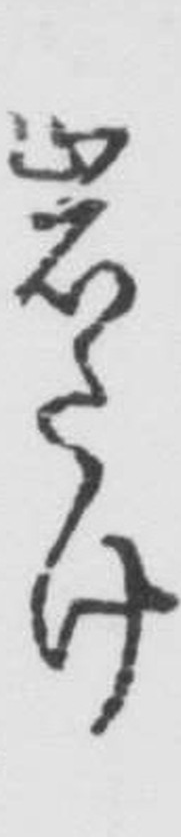岩たけ
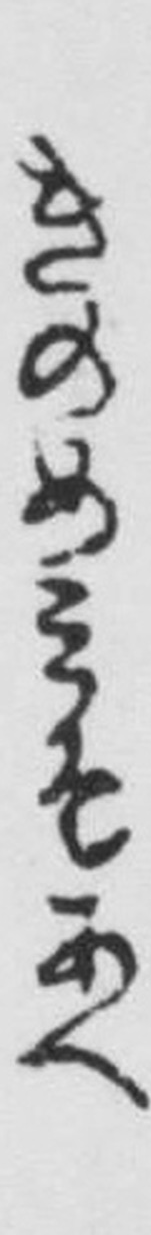きのめみそあへ
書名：諸家通用/即席料理
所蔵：大阪府立大学学術情報センター 国文学研究資料館
